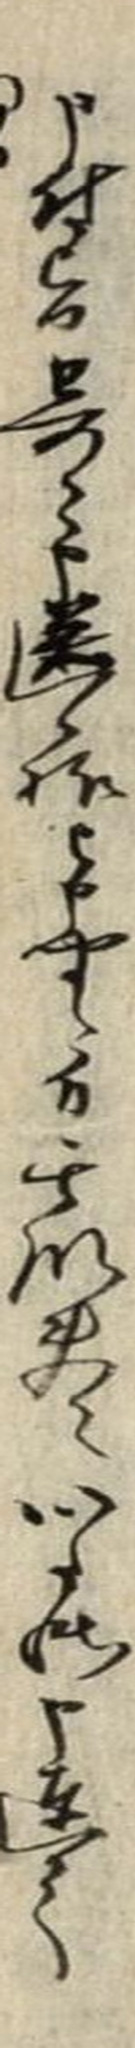申付旨寄々申送候様被申聞候に付其段夫々以手紙申達之
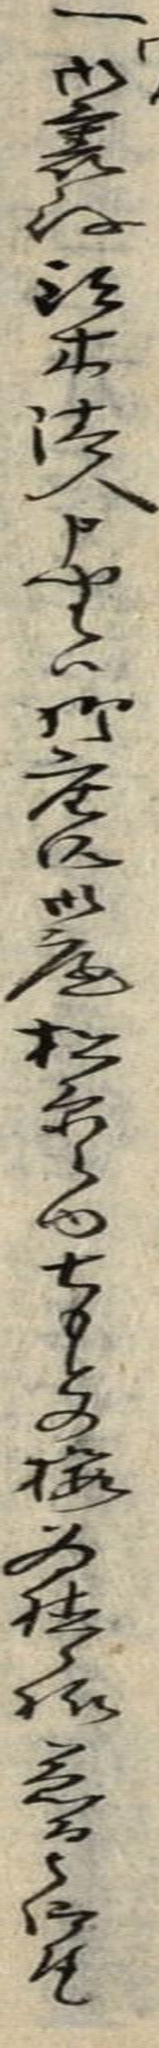一御裏役鈴木清八申聞候は御座所御庭松原之内ちもとの桜為植候様兼て被仰付候
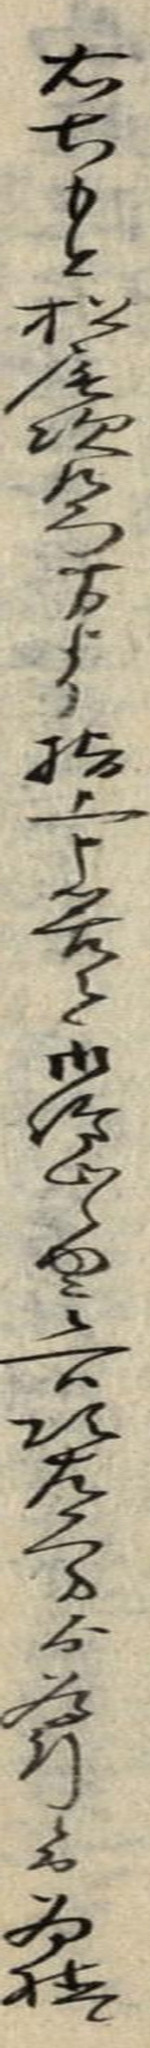右ちもと松尾次左衛門方より指上申筈に候御停止之内に候へは次左衛門方ゟ為引候て為植候
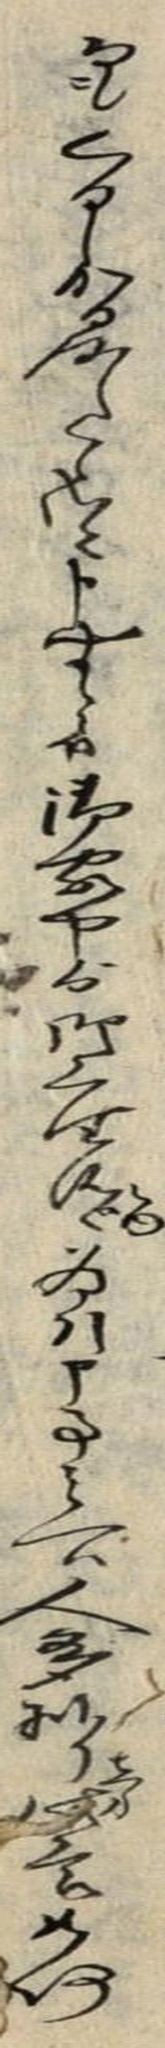てもくるしかるましく候哉と申聞候に付御家中ゟ御座所◦之内へ為引申事に候へは人多掛り旁此節如何
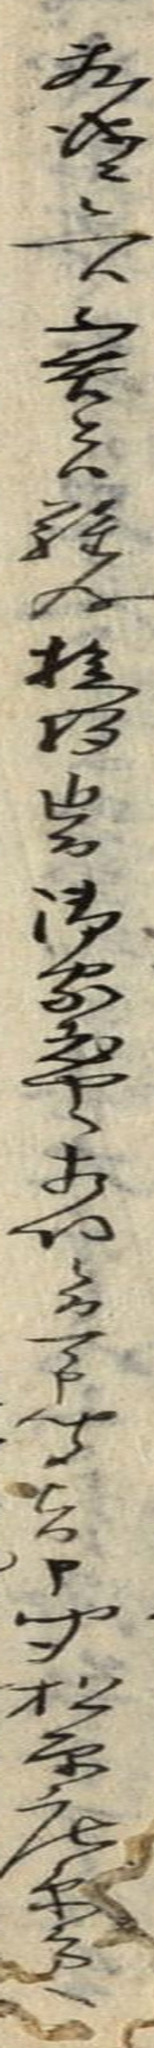敷儀に候へは不苦とは難及挨拶追て御家老中へ相伺候て可申聞旨申聞松原庄兵衛方へ
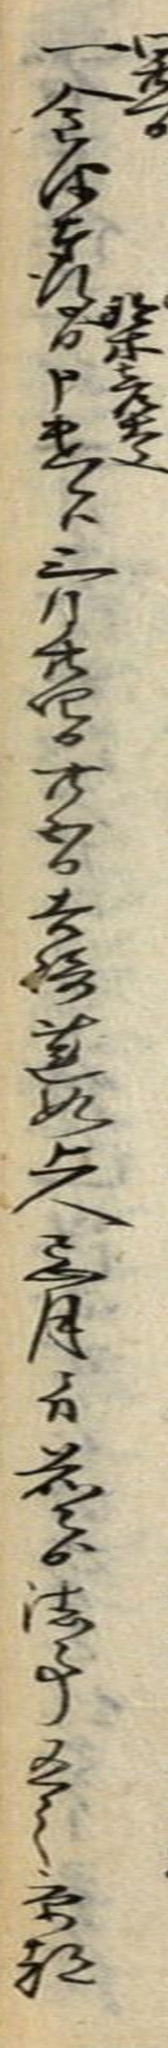一金津奉行◦鈴木彦大夫ゟ申遣候は三月廿四日廿五日吉崎蓮如上人忌月に付前々ゟ法事有之京都
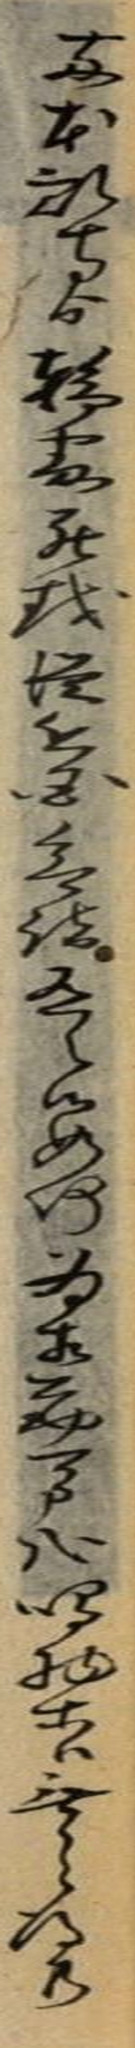両本願寺ゟ輪番罷越従近国参詣有之候如何為相勤可申哉鳴物等は無之候得共
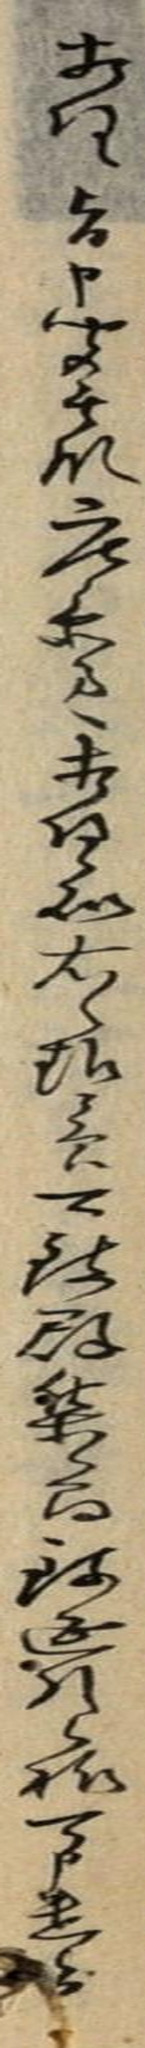相伺候旨申聞其段庄兵衛方へ相伺候処右之趣にては可致群集候間致延引候様可申遣旨
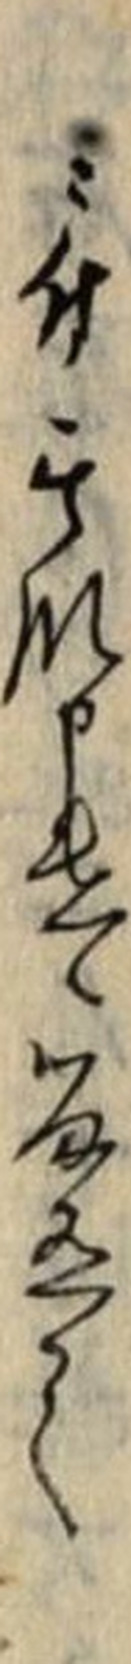に付其段申遣候留有之
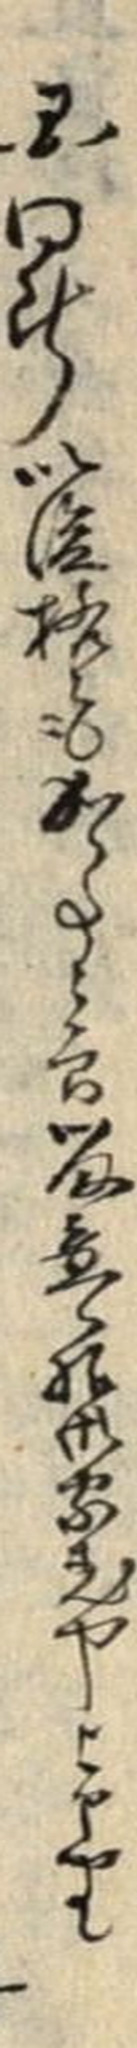国同断以後格にも成候事に候間留置候様御家老中被申聞候
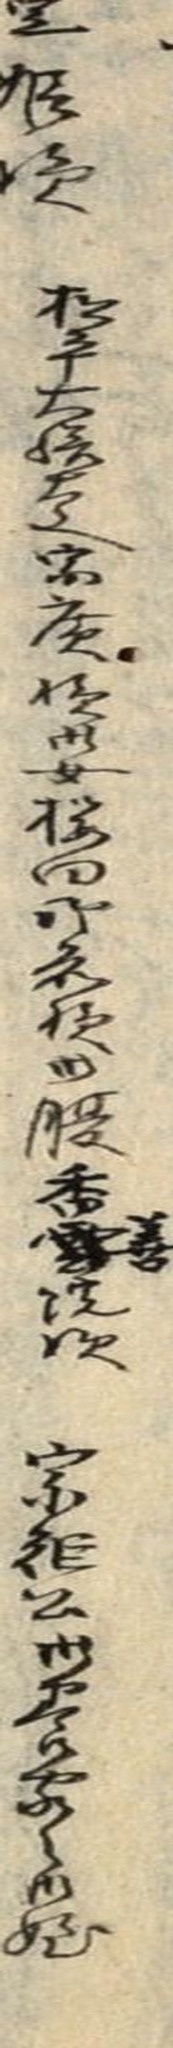一豊姫様松平大膳大夫宗広様御女桜田御前様御腹香善院様宗矩公御養家之御姪
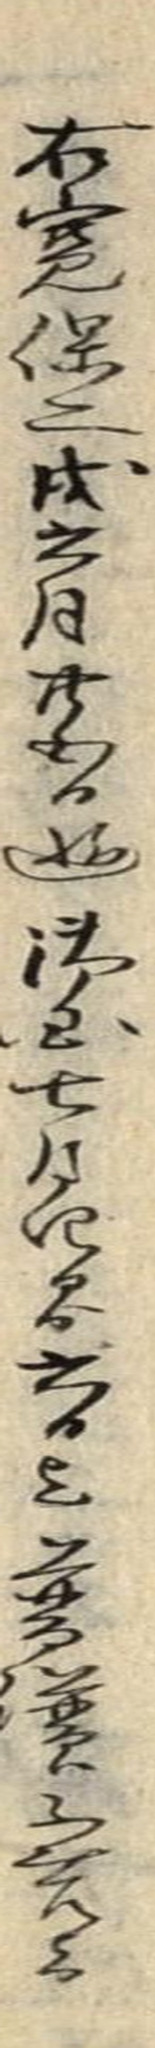右寛保二戌六月廿五日逝御国七月四日ゟ六日迄普請は不苦旨
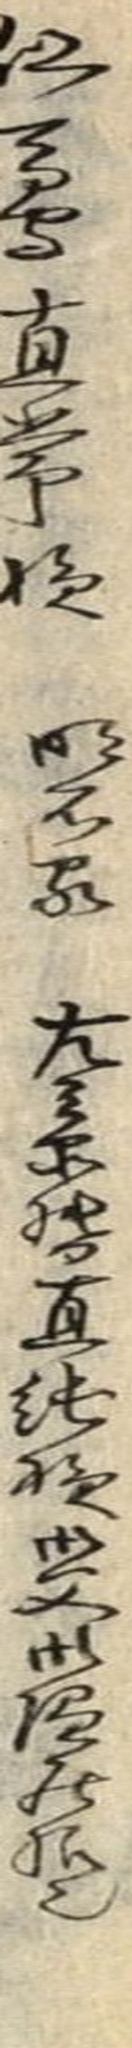一但馬守直常様明石家左兵衛督直純様御父御隠居様也
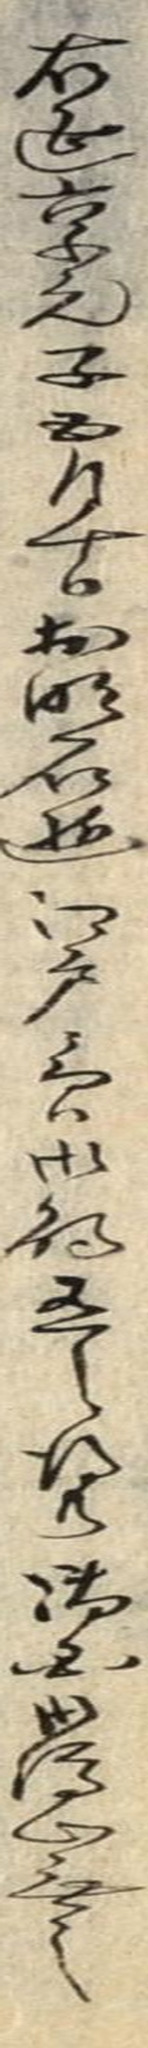右延享元子五月十日於明石逝江戸にては御触有之候得共御国御停止無之
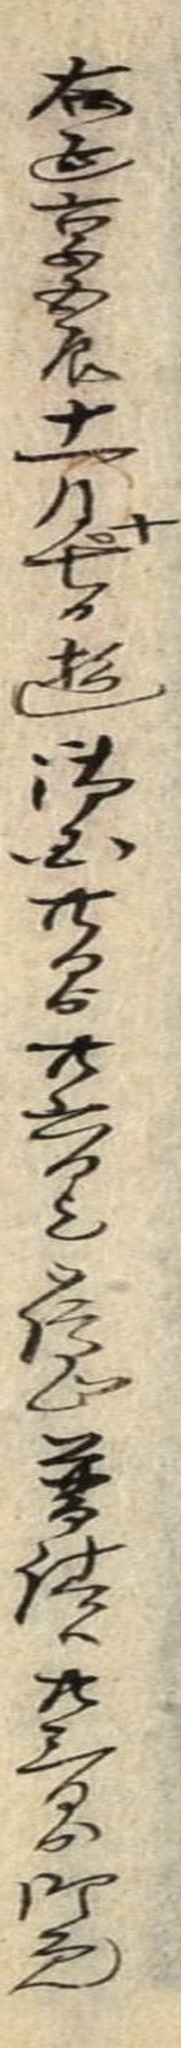右延享五辰十一月十七日逝御国廿日ゟ廿六日迄御停止普請は廿三日ゟ御免
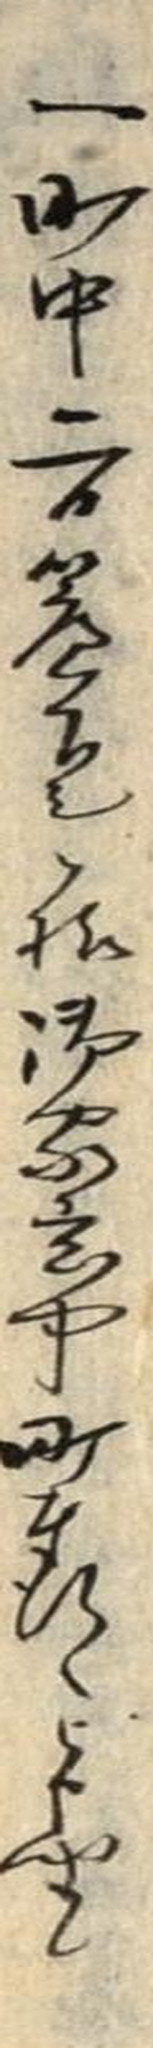一町中二日簾下シ候様御家老中町奉行へ被申聞候
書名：御停止異変死失
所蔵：福井県文書館 Fukui Prefectural Archives
